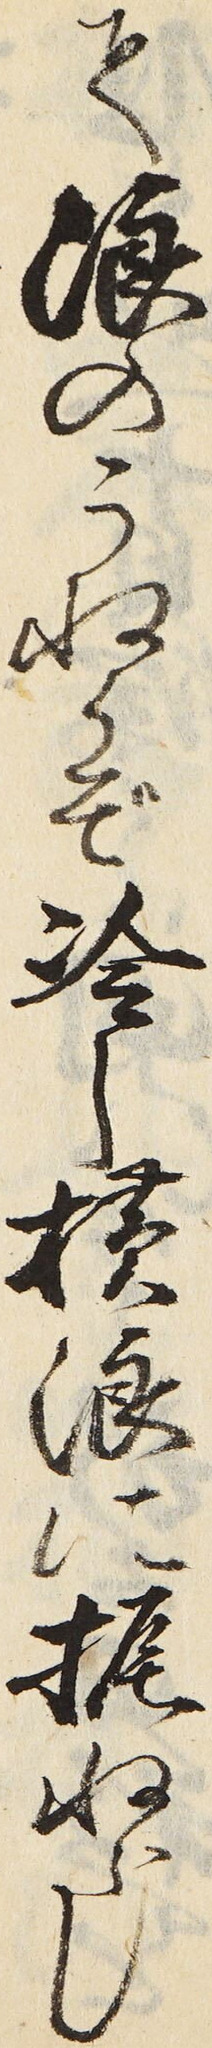て浪のうねりぞ冷し横浪に梶ねらし
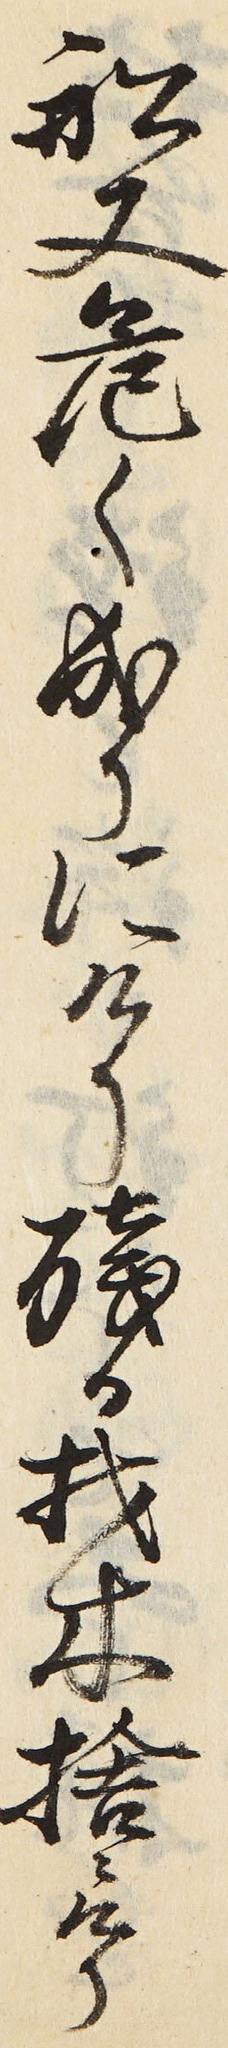船又危く成りにけり残る材木捨にけり
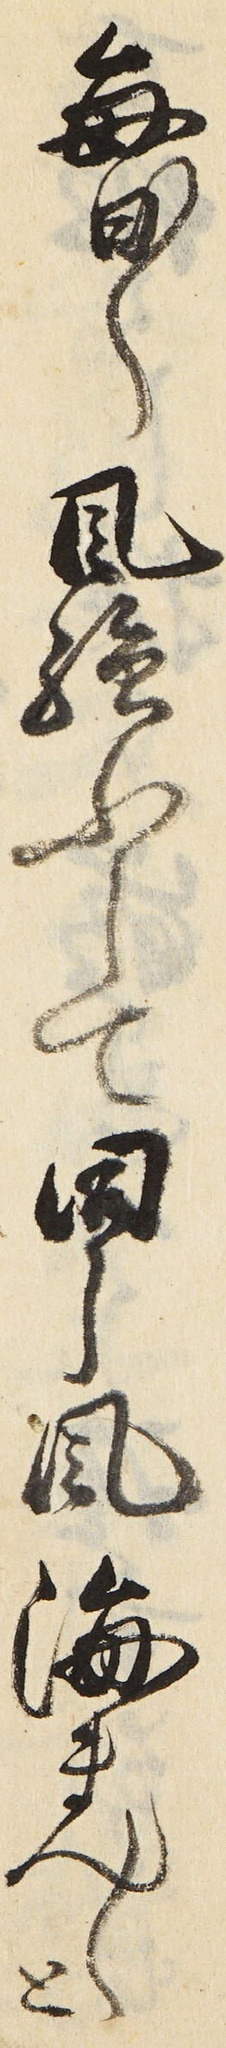毎日〳〵風強ふして同し風海まん〳〵と
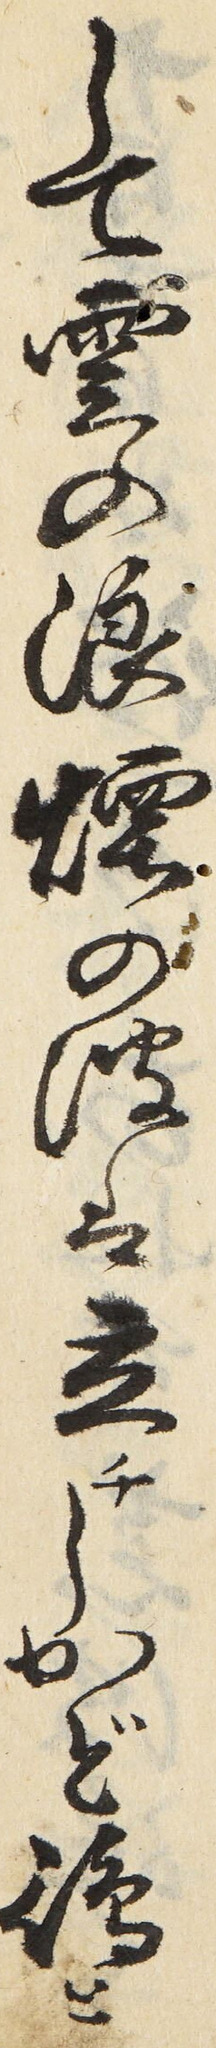して雲の浪煙の波は立ちしかど嶋と
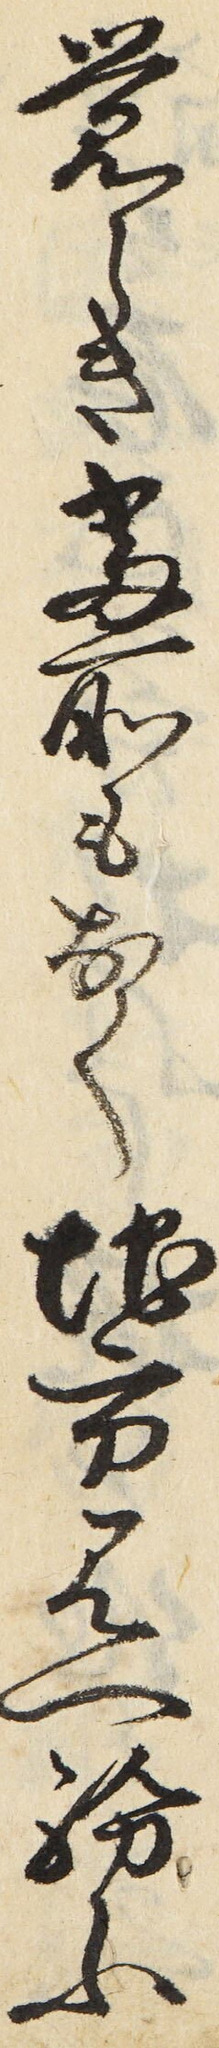覚しき当所もなく地方見へ紛ふ
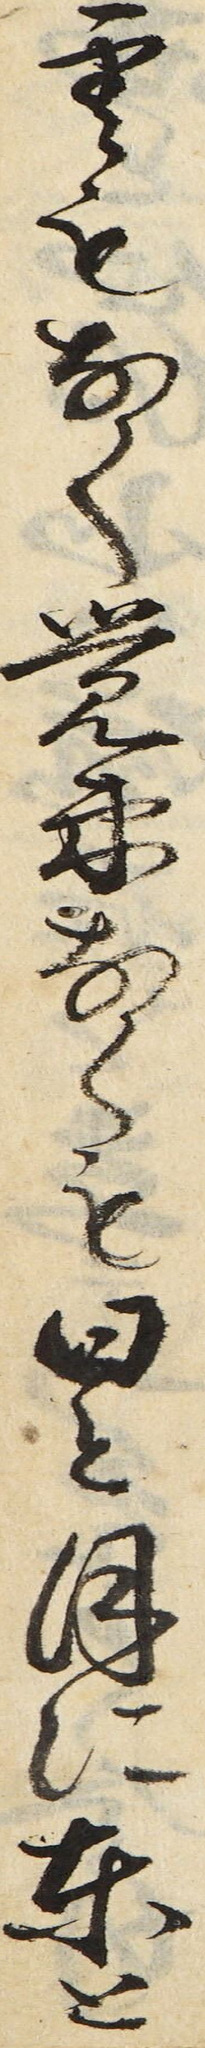雲もなく覚束なくも日と月に東と

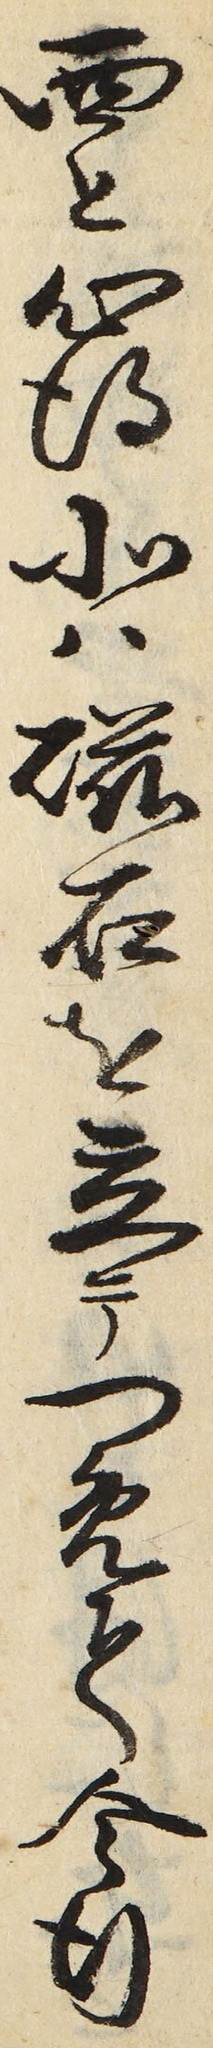西と心得北は磁石を立てつめて今行
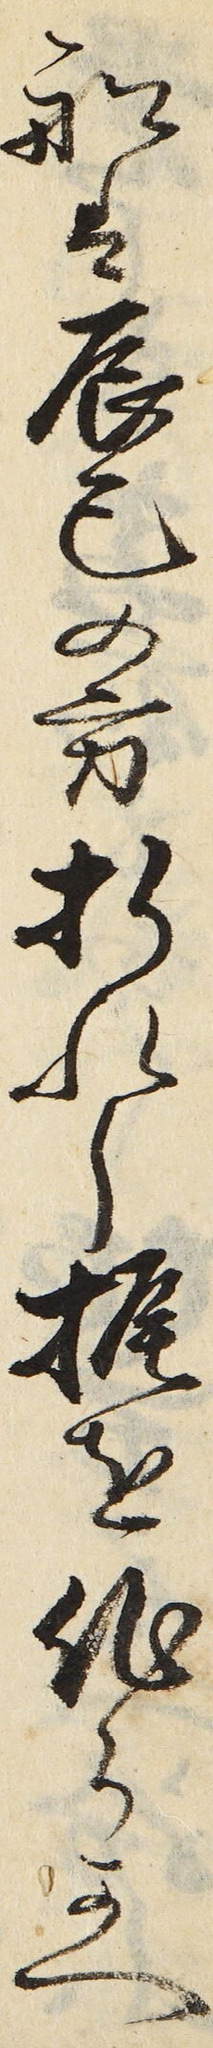船は辰巳の方折れし梶を作りかへ
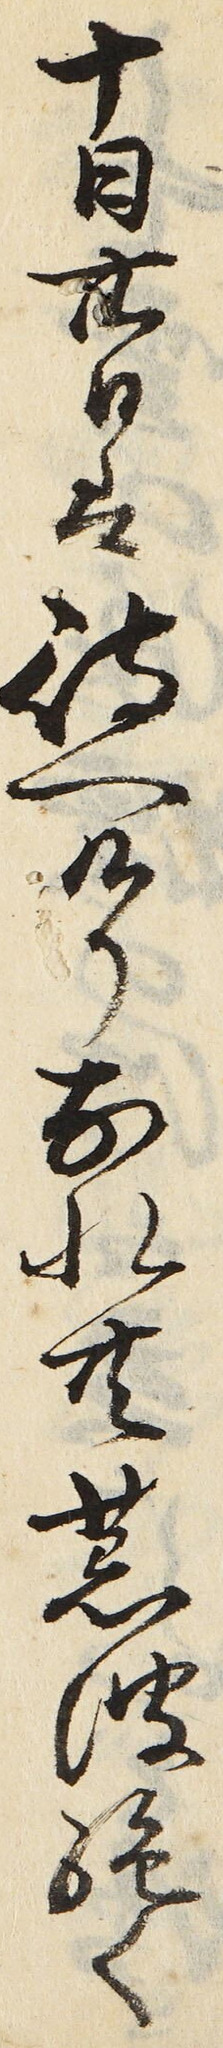十日廿日は待へけりなれ共荒波強く
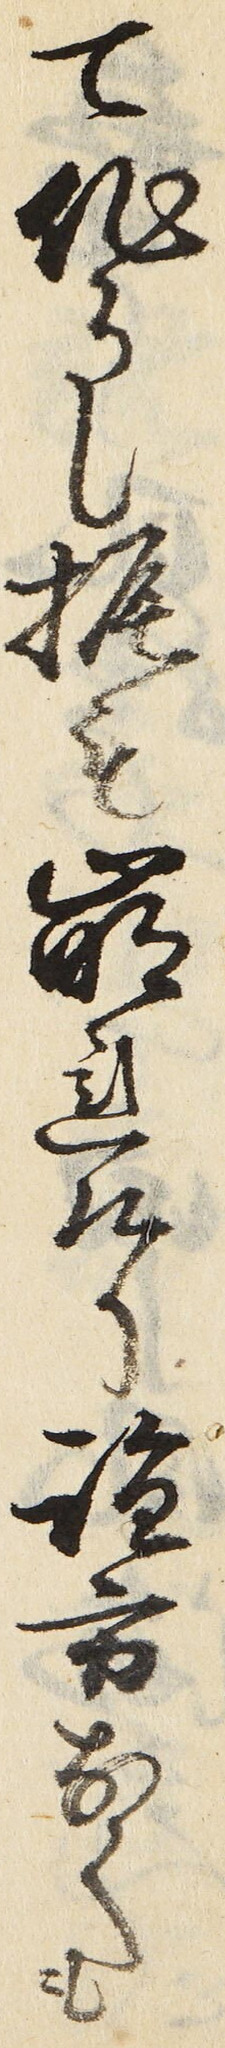て作りし梶も崩れけり詮方なくも
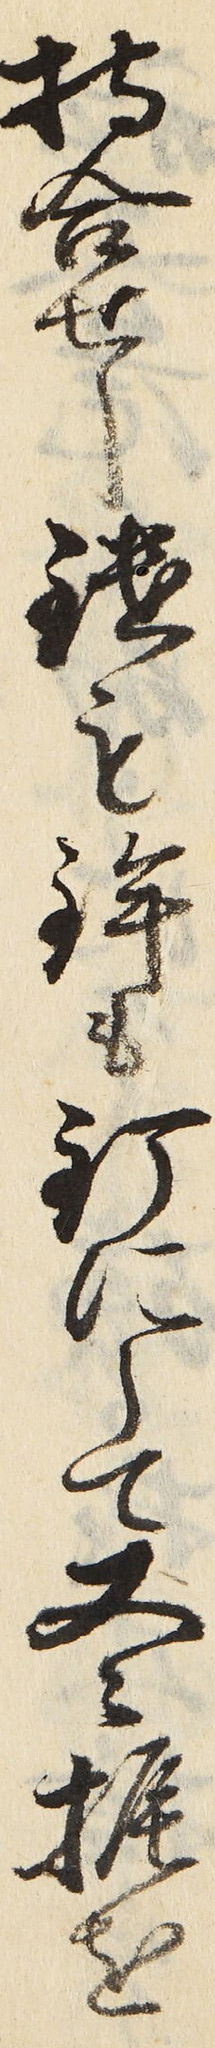持合せし鑓も鉾も釘にして又々梶を
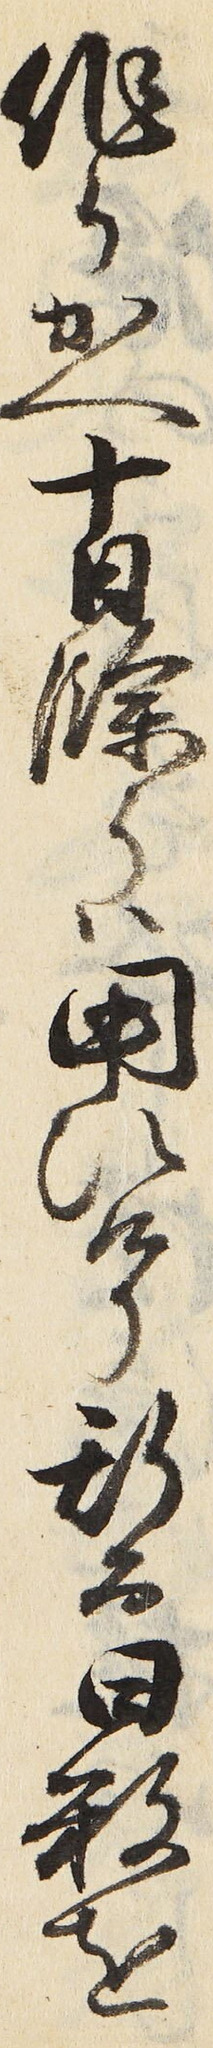作りかへ十日余りは用ひけり斯而日数を
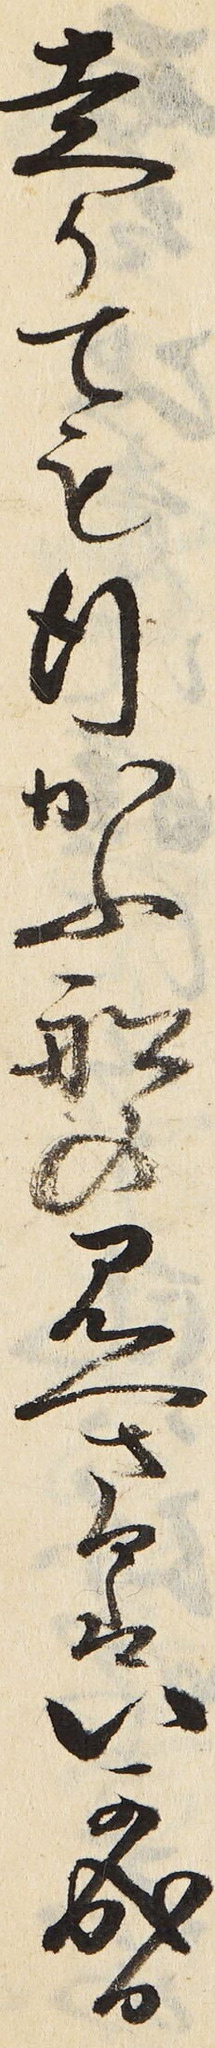走りても行かふ船の見へさるはいか成る
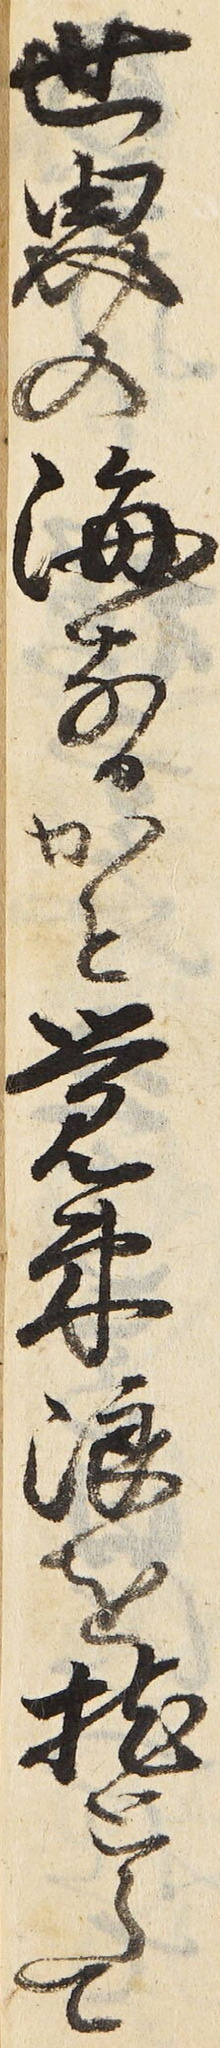世界の海なるかと覚束浪を枕として
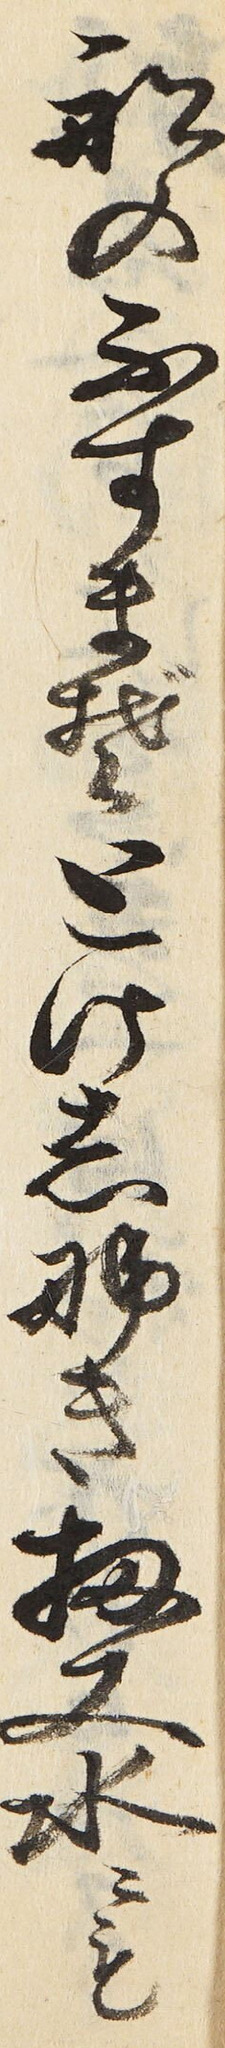船のふすまぞとけしなき扨又水にも
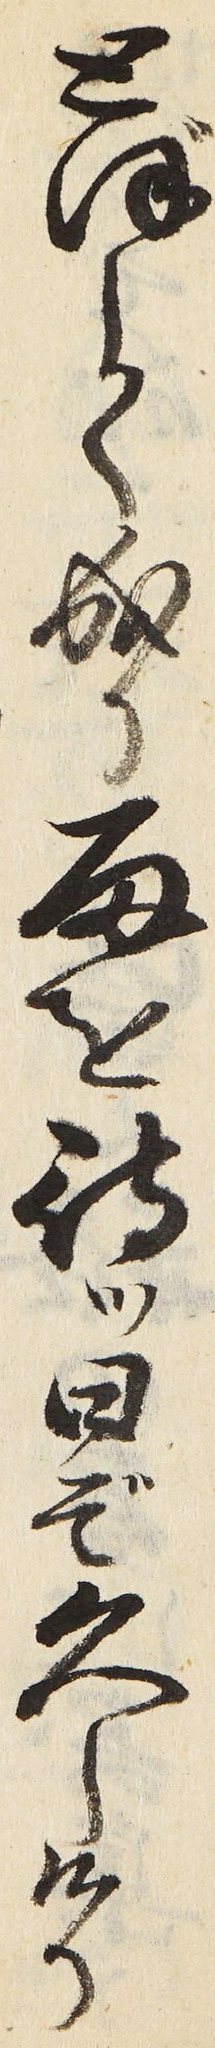とぼしく成り雨を待つ日ぞ久しけり
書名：華夷九年録
